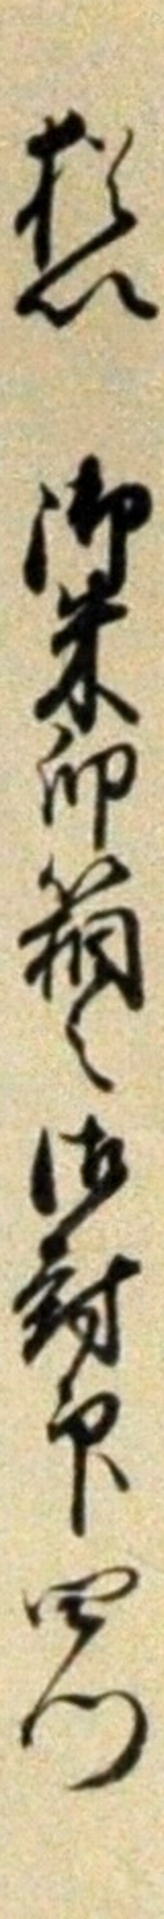猶以御朱印箱之御封印四ツ
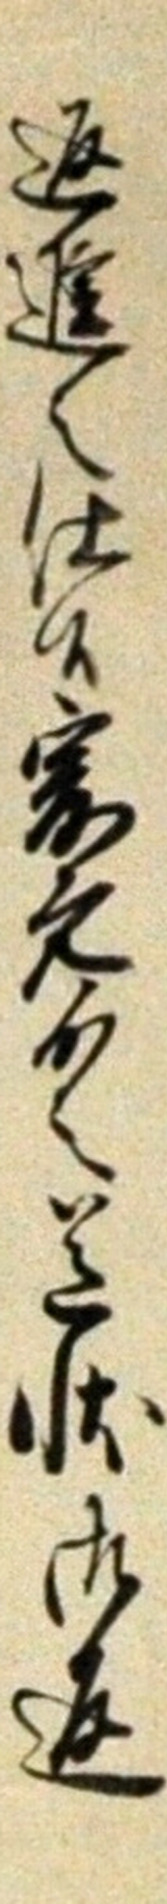返進之仕候爰元ゟ之送状御返
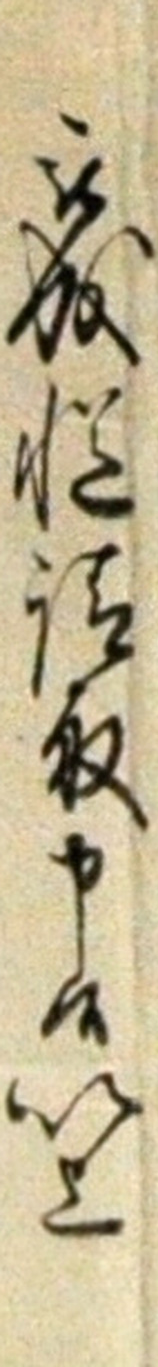被成慥請取申候以上
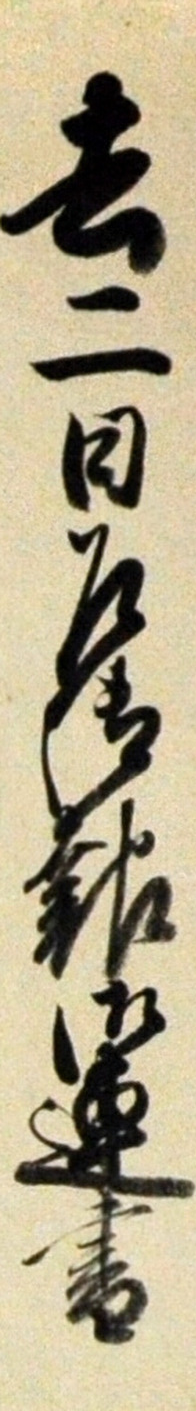去二日乍御報御連書
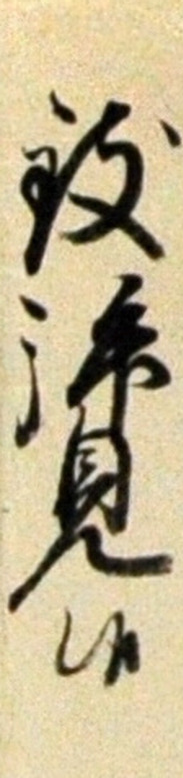致拝見候
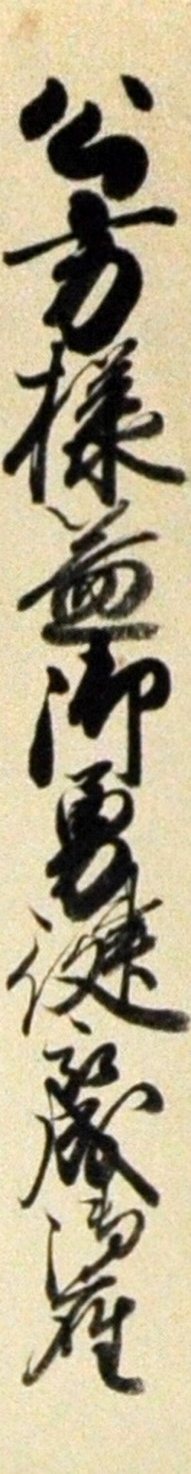公方様益御勇健被成御座
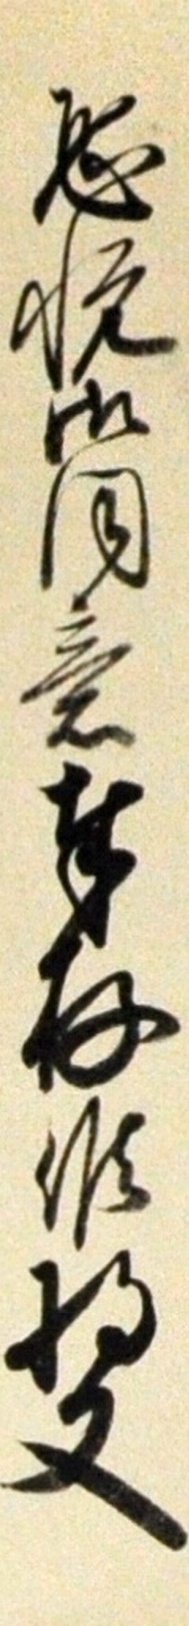恐悦御同意奉存候将又
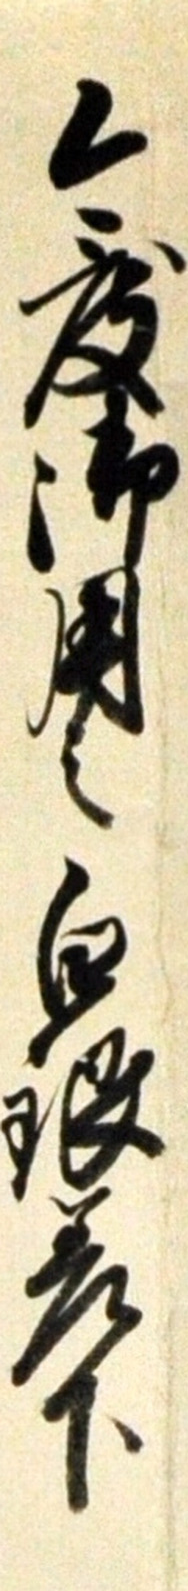今度御用之白銀差下
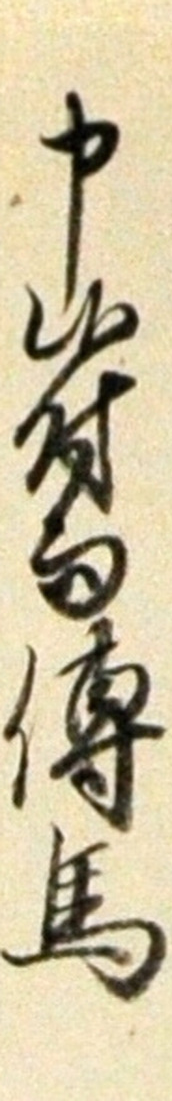申候付て伝馬
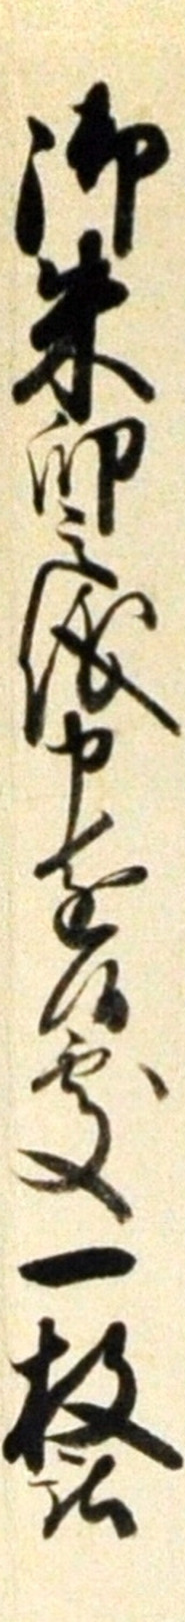御朱印之儀申進候処一枚被
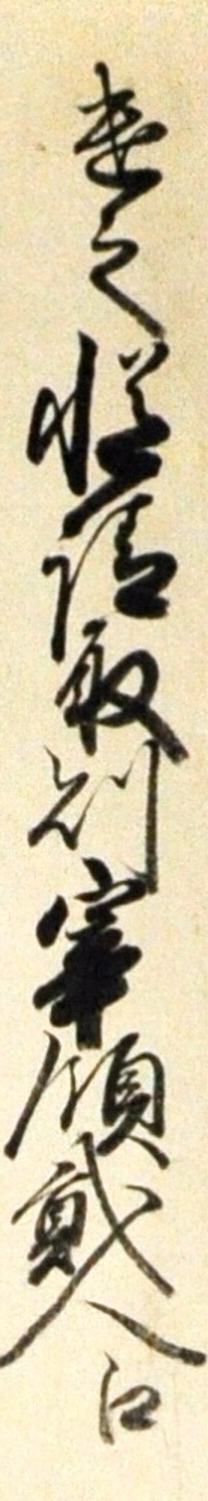遣之慥請取則宰領弐人え
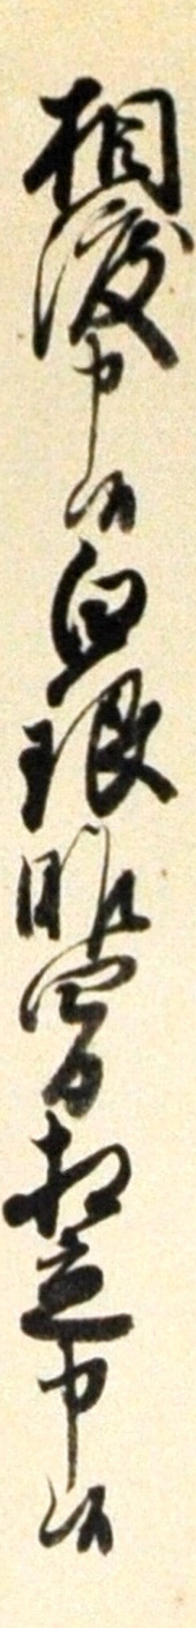相渡申候白銀昨四日相立申候
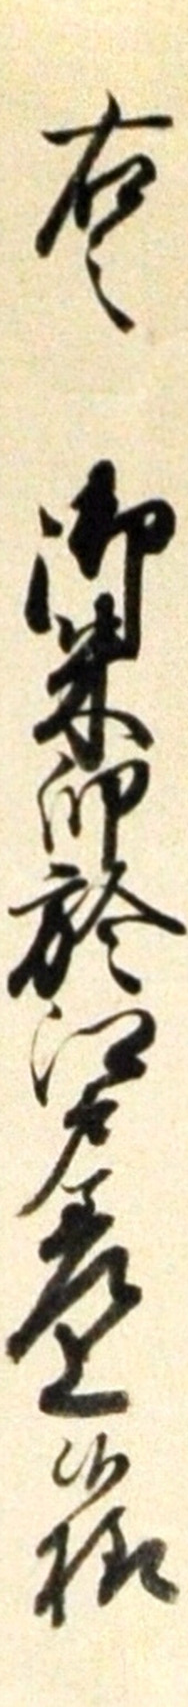右之御朱印於江戸差上候様
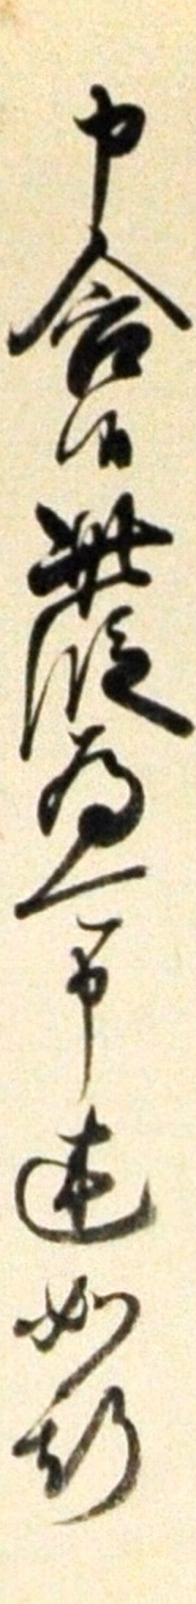申含候此段為可申述如斯
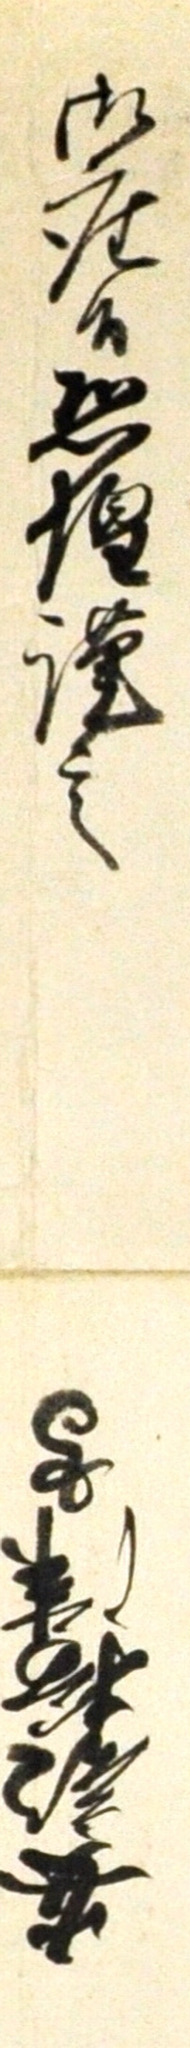御座候恐惶謹言
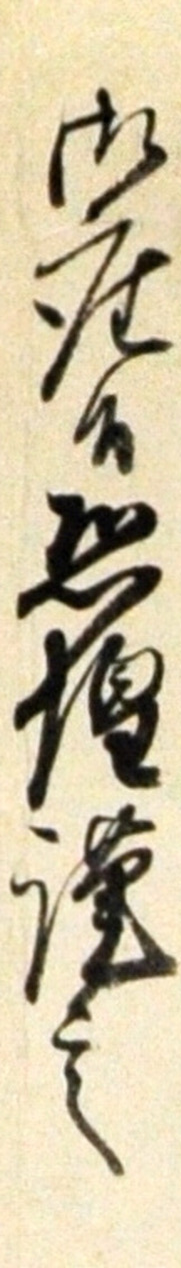御座候恐惶謹言
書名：書状
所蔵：伊那市立高遠町図書館・合同会社AMANE
